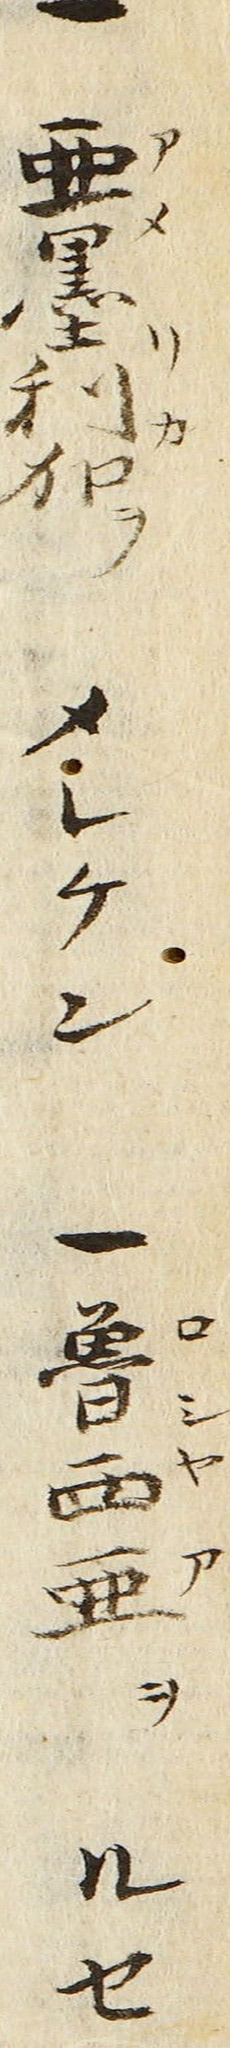一亜墨利加ヲメレケン一魯西亜ヲルセ
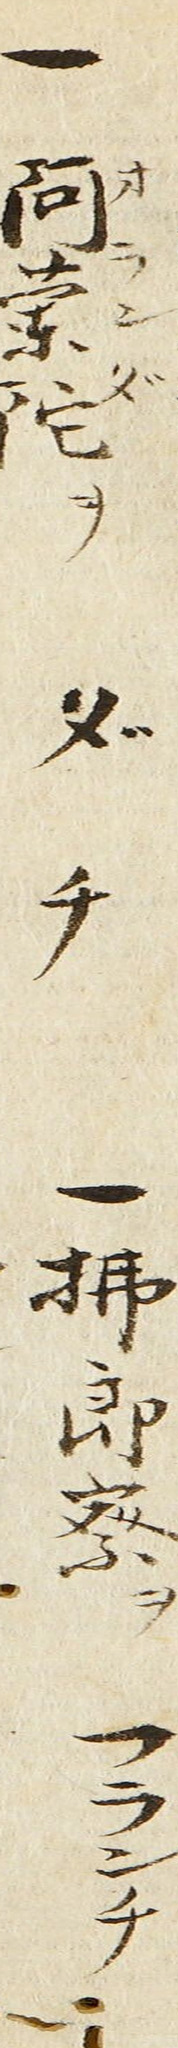一阿蘭陀ヲダチ一仏郎察ヲフランチ
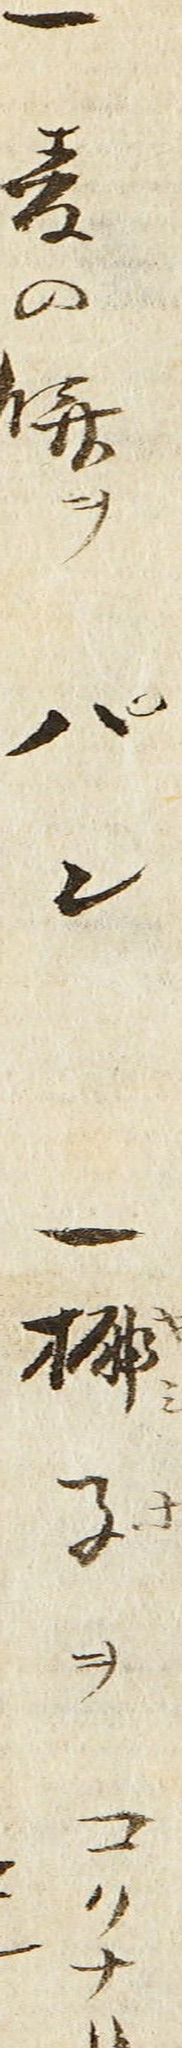一麦の餅ヲパン一椰子ヲコリナリ
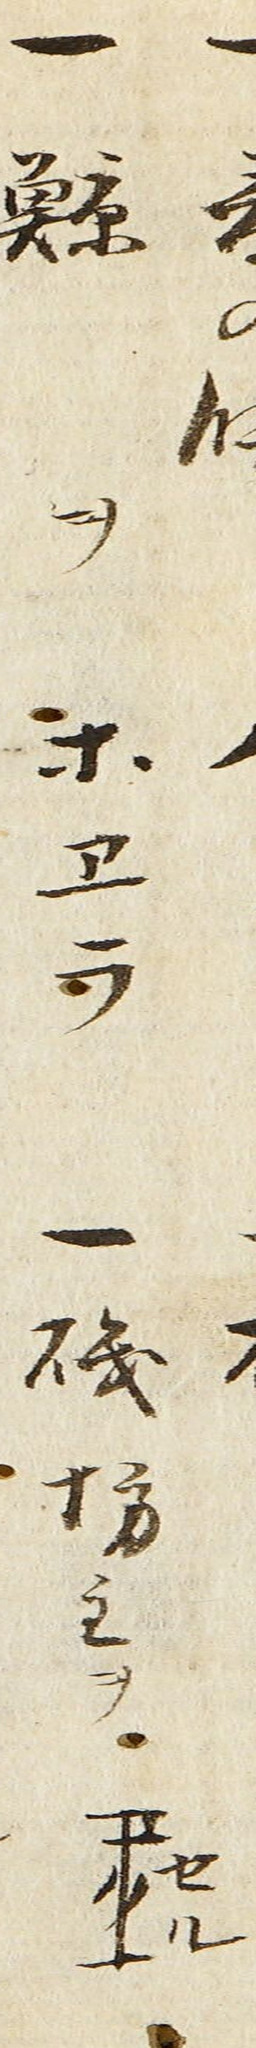一鯨ヲホエラ一磯坊主ヲセル
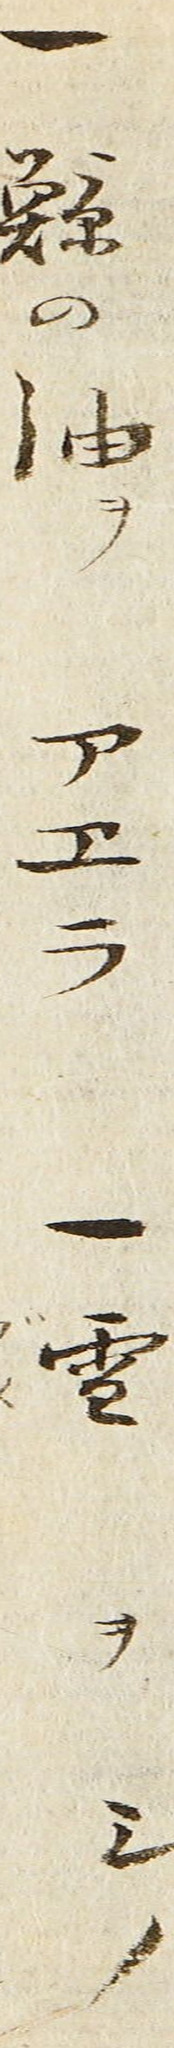一鯨の油ヲアエラ一雪ヲシノ
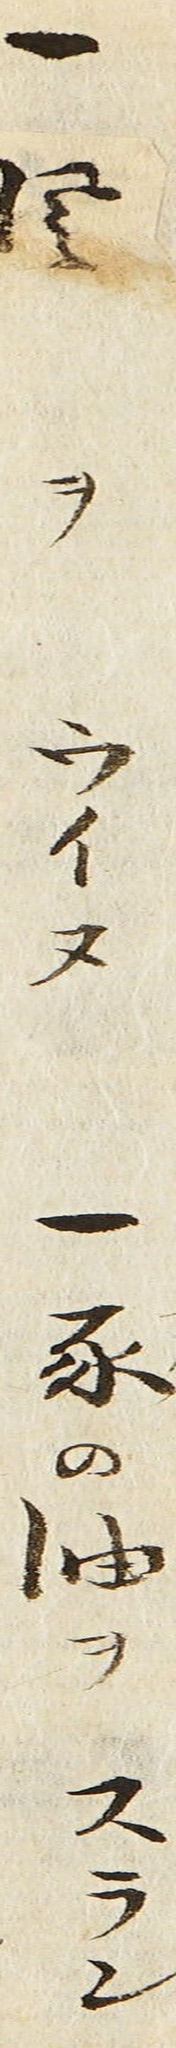一風ヲウイヌ一豕の油ヲスラン
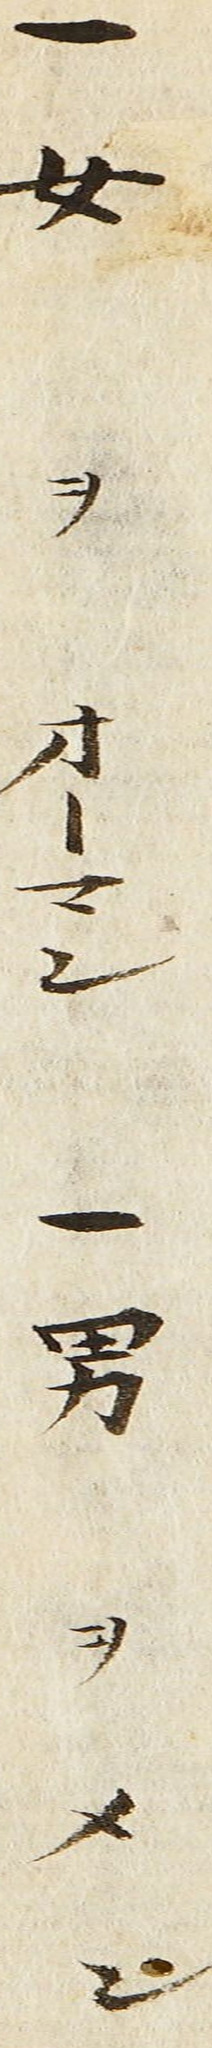一女ヲオーマン一男ヲメン
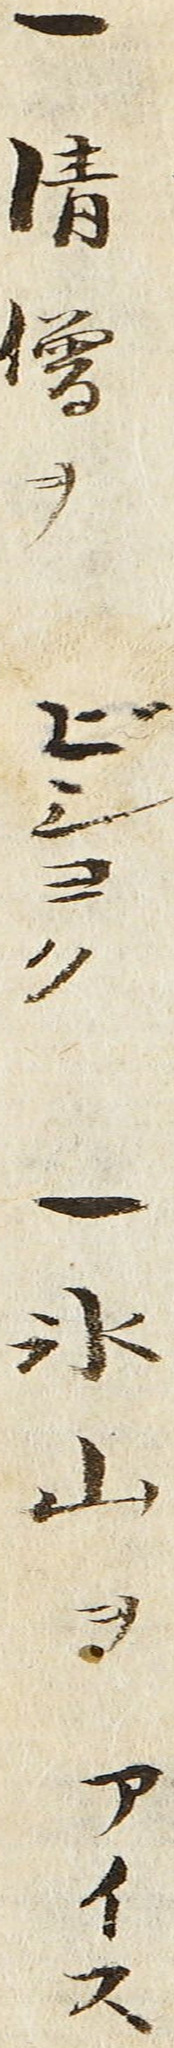一清僧ヲビシヨク一氷山ヲアイス
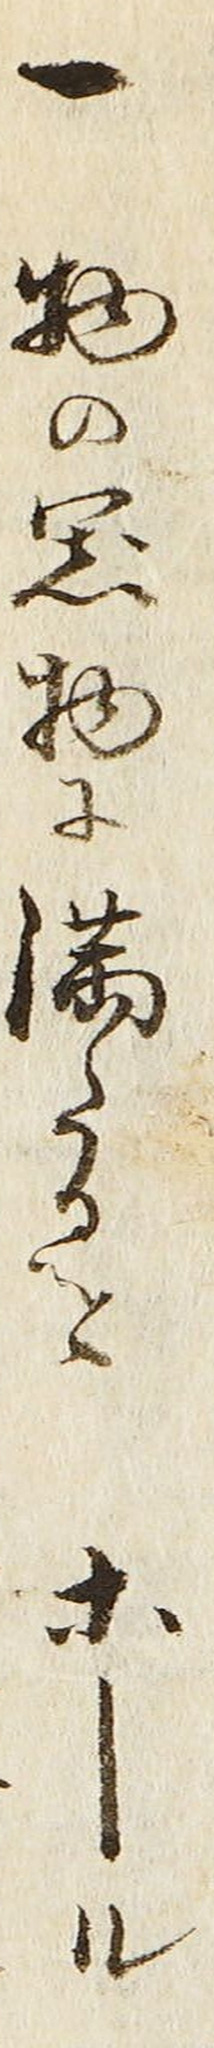一物の器物に満たるをホール
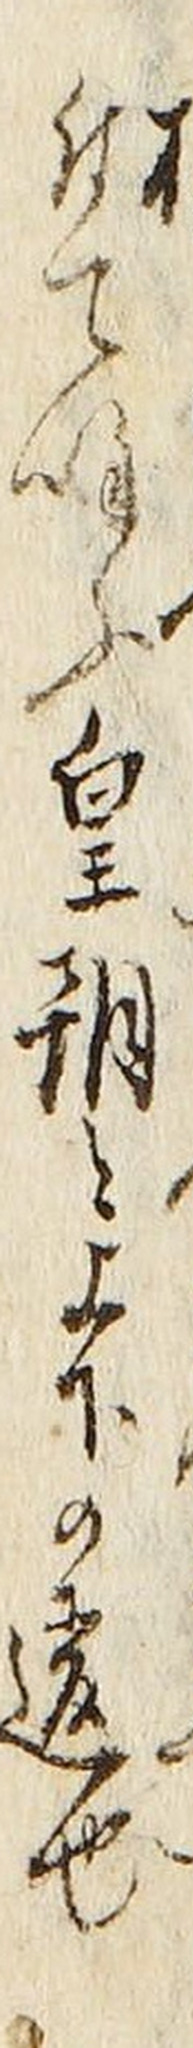付て呼ふ皇朝と上下の違也
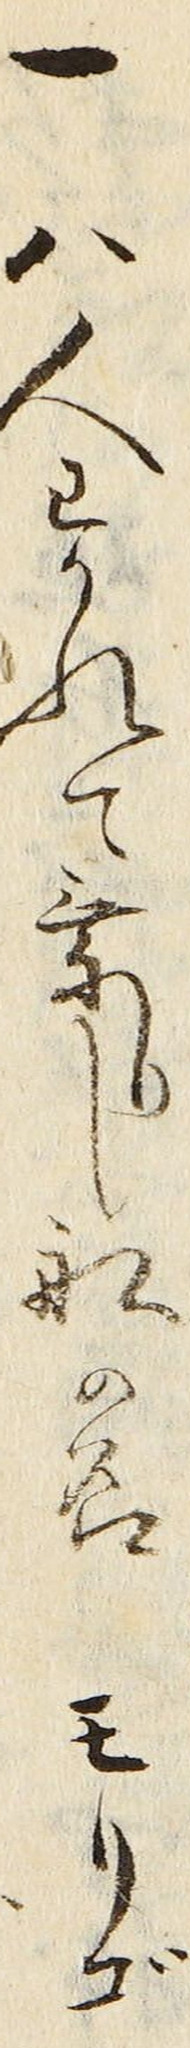一八人わかれて乗りし船の名モリゴ
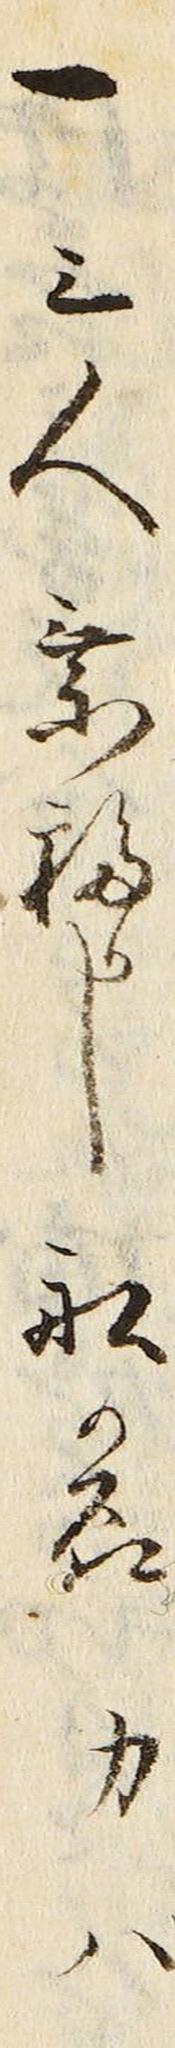一三人乗移りし船の名カバ
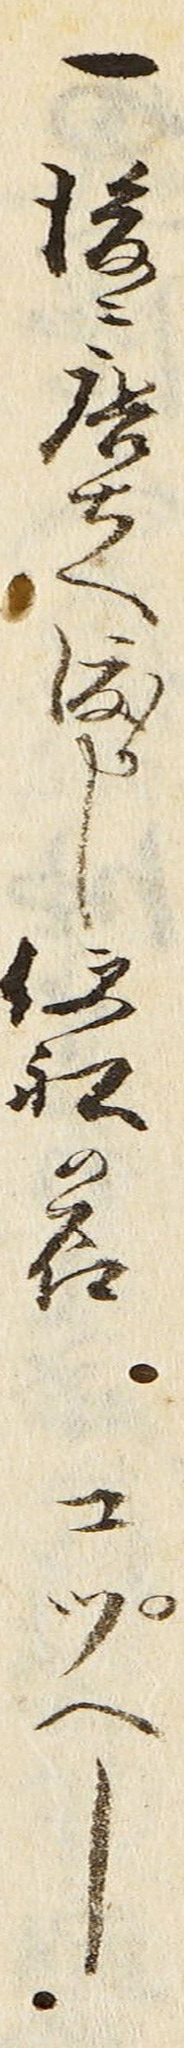一後ニ唐土へ渡りし便船の名コツヘー
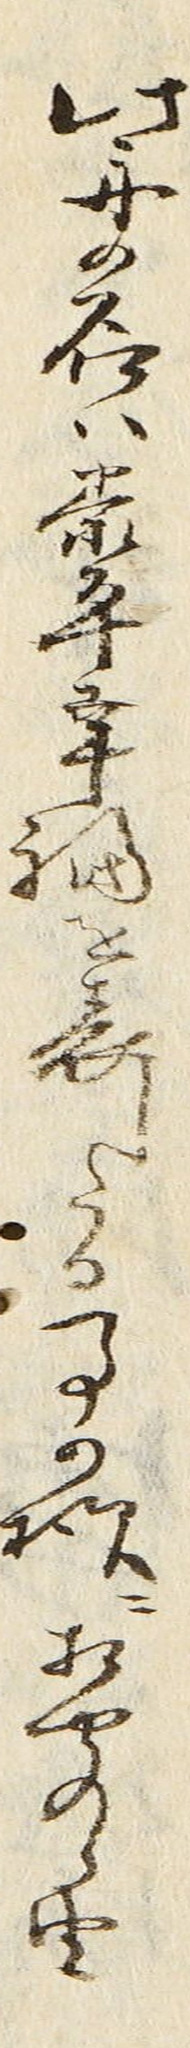此舟の名ハ平幸福を表したる事の様ニ相聞候由
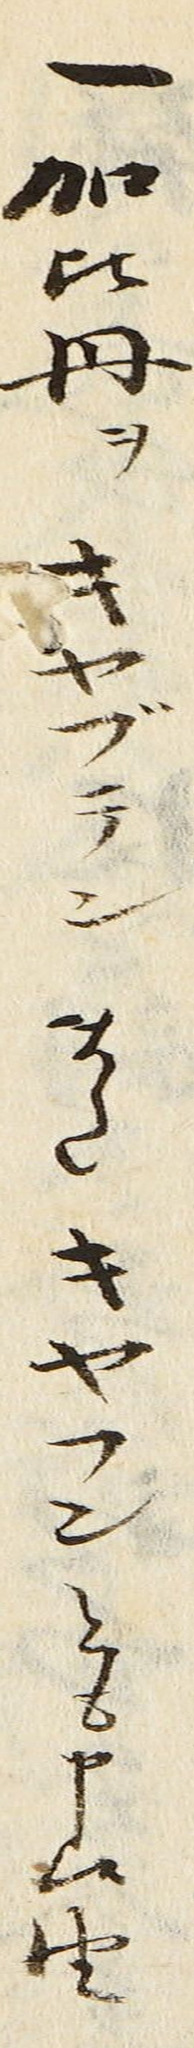一加比丹ヲキヤブテンまたキヤフンとも申候由
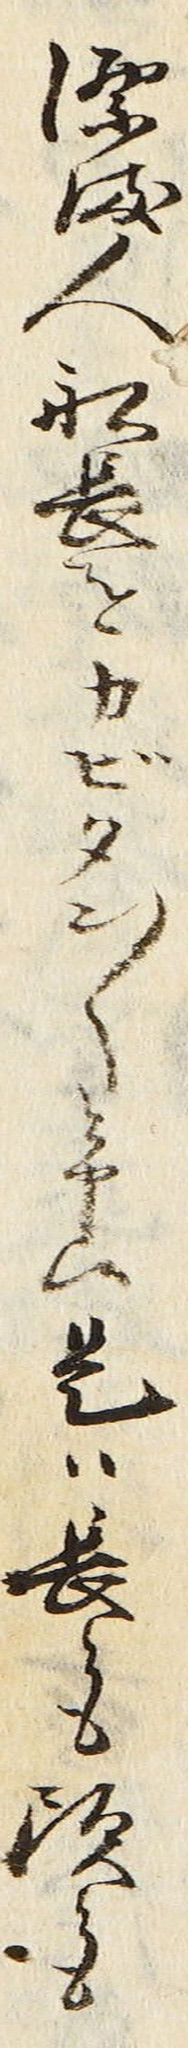漂流人船長をカビタン〳〵と申候是ハ長とも頭とも
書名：亜墨利加漂流記聞
